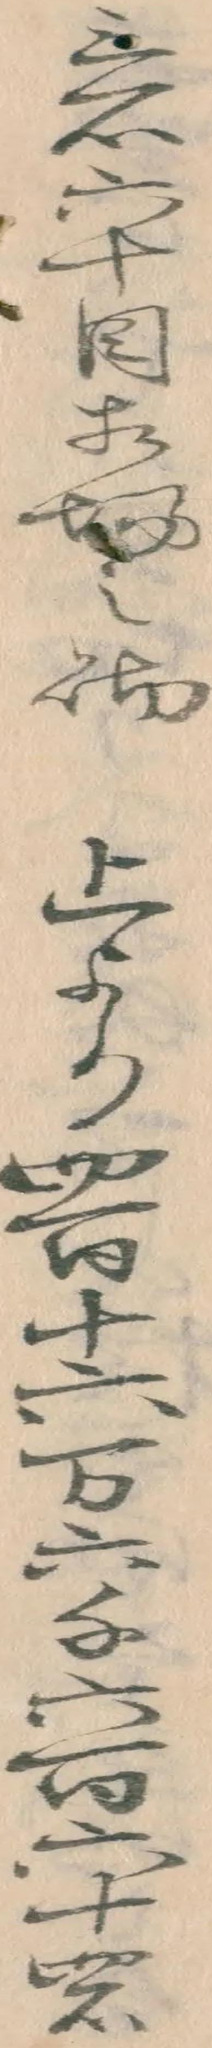三石六十目相場之砌上より四百十六万六千六百六十四石
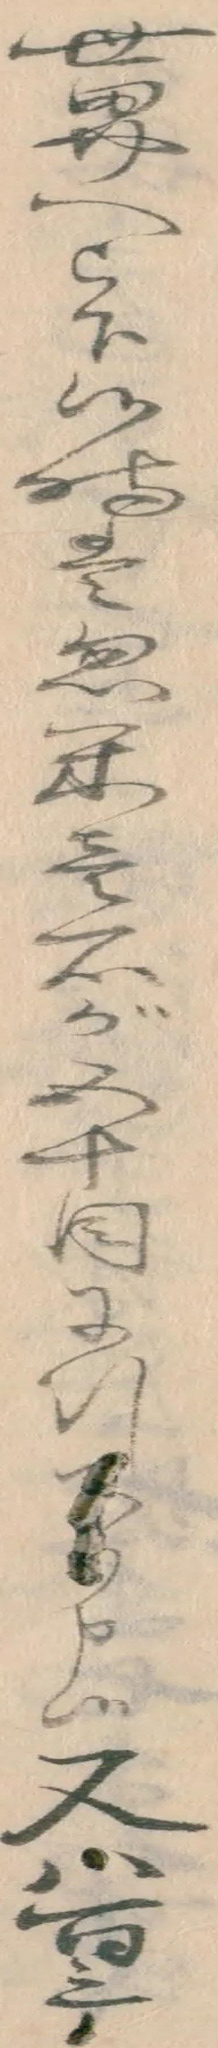世界へ被下候時は忽米壱石が五十目に引下り申候又は百三
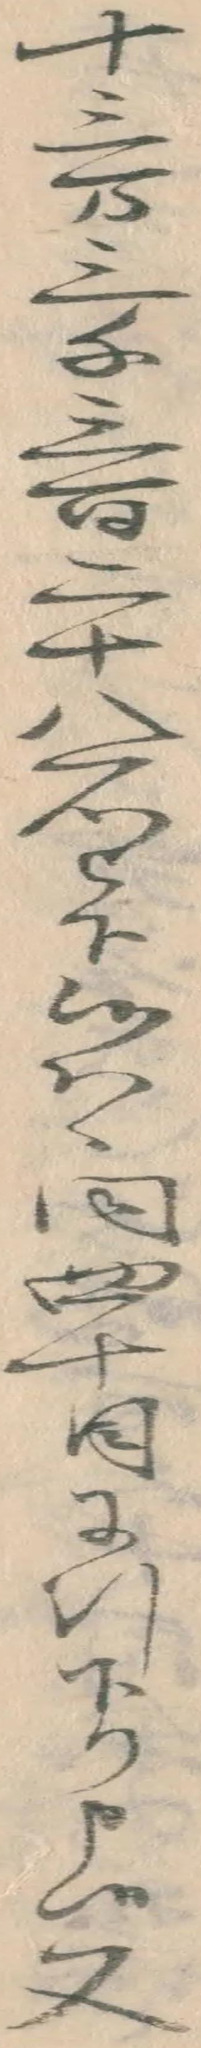十三万三千三百二十八石被下候はゝ同四十目に引下り申候又
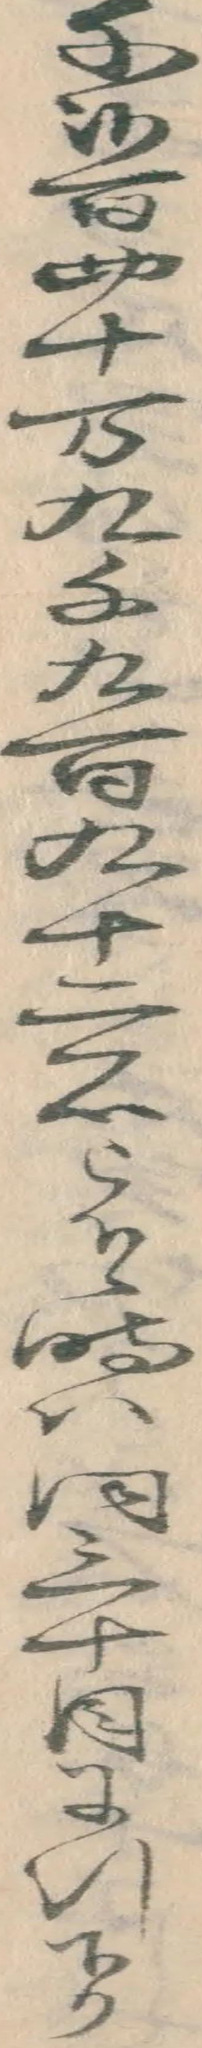千弐百四十万九千九百九十二石被下候時は同三十目に引下り
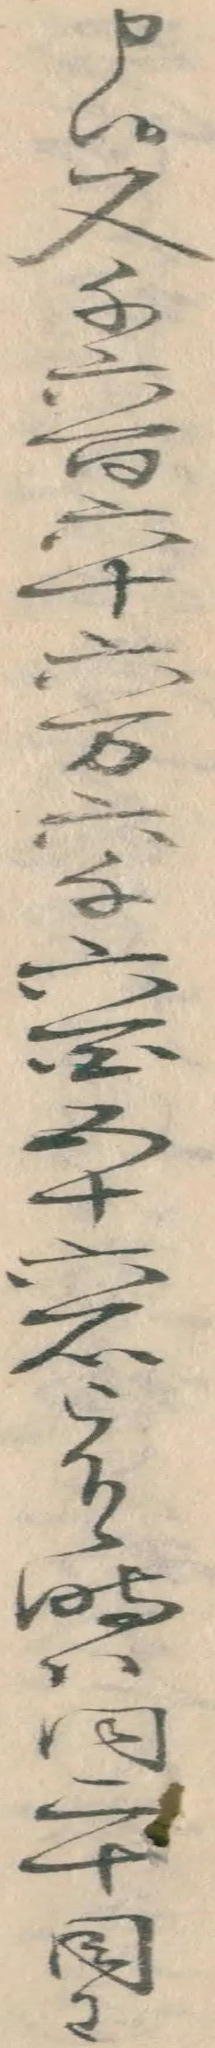申候又千六百六十六万六千六百五十六石被下候時は同二十目に
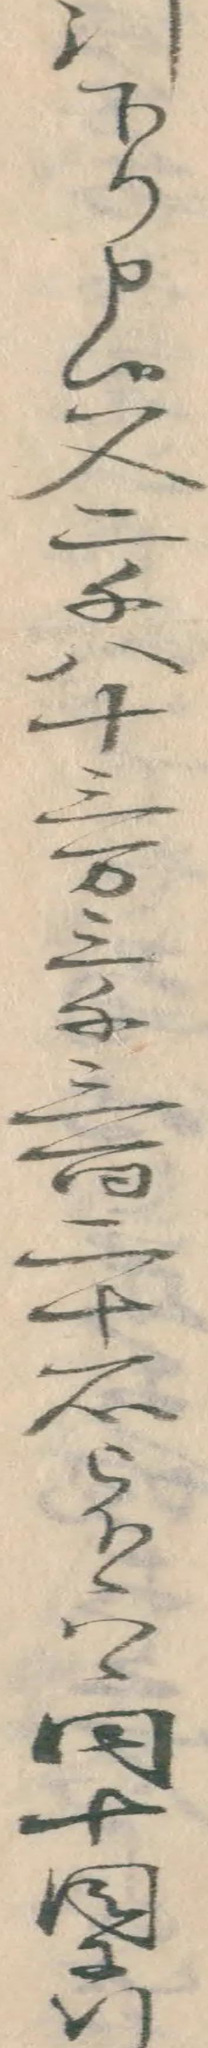引下り申候又二千八十三万三千三百二十石被下候はゝ同十目に引
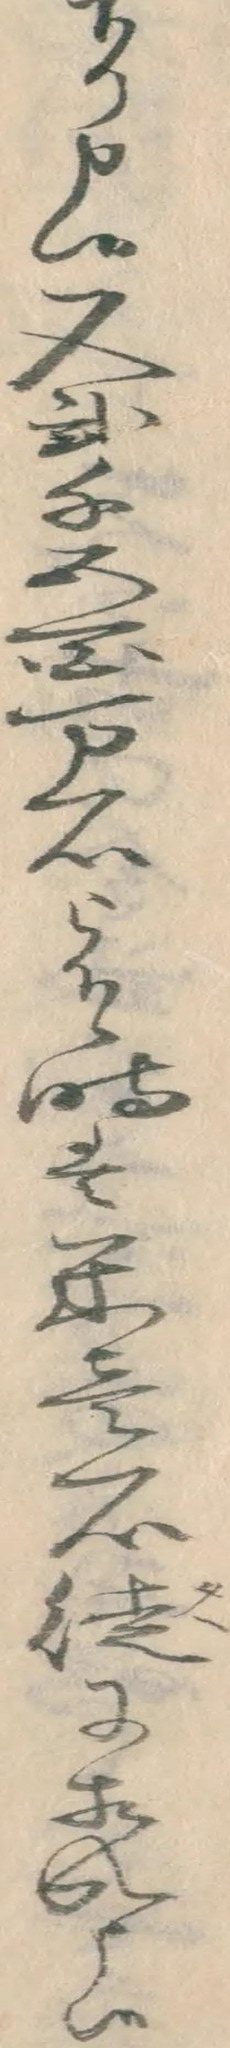下り申候又弐千五百万石被下候時は米壱石徒に相成申候
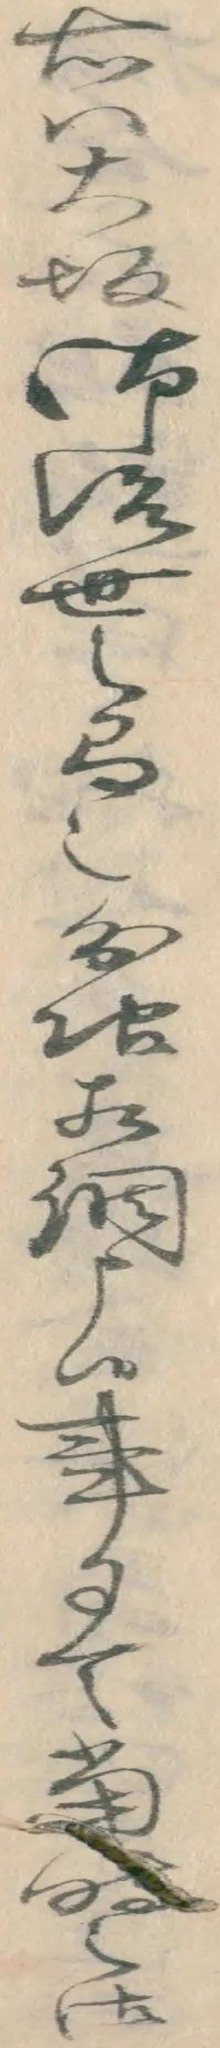右は大坂御治世之間之分限相調申候事にて当時之御

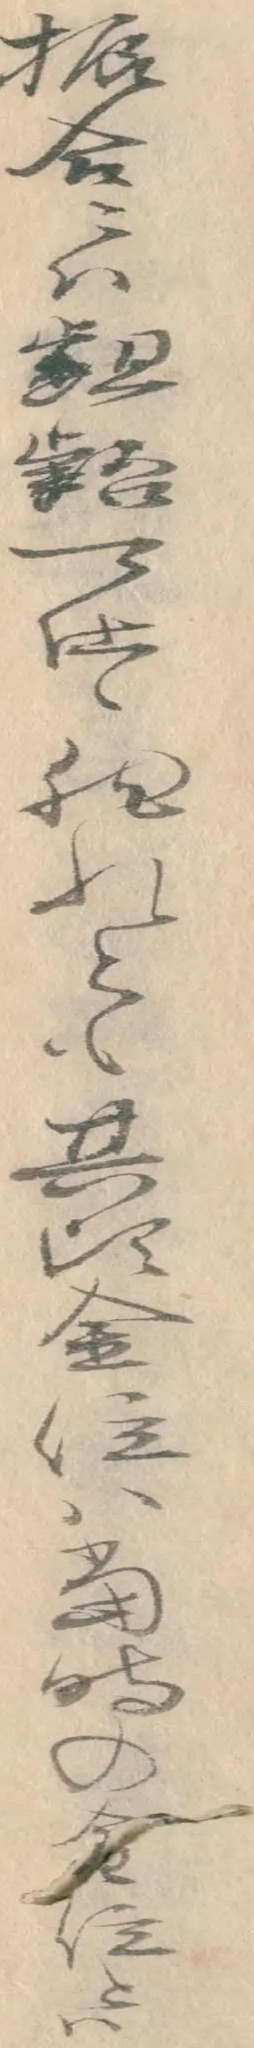振合には齟齬可仕候然れとも其頃金位は当時の金位とは
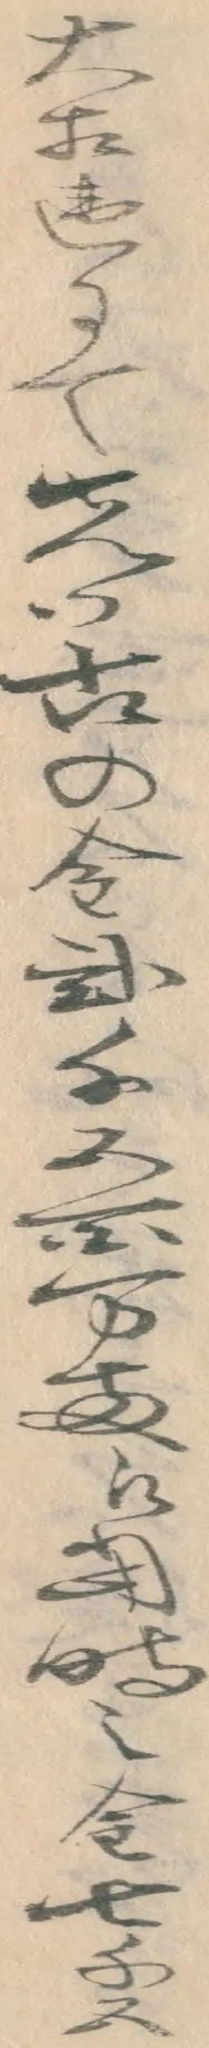大相違にて先つ古の金弐千五百万凡当時之金七千五
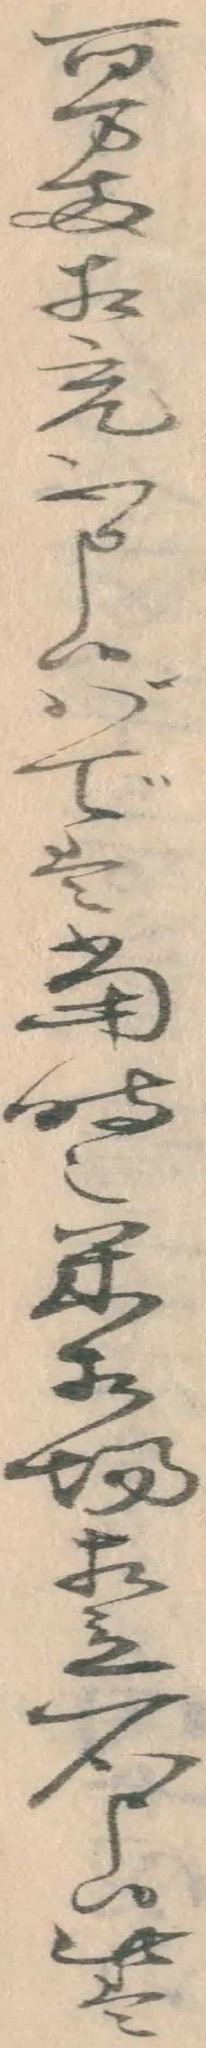百万両相充不申候ばでは当時之米相場相立不申候此は
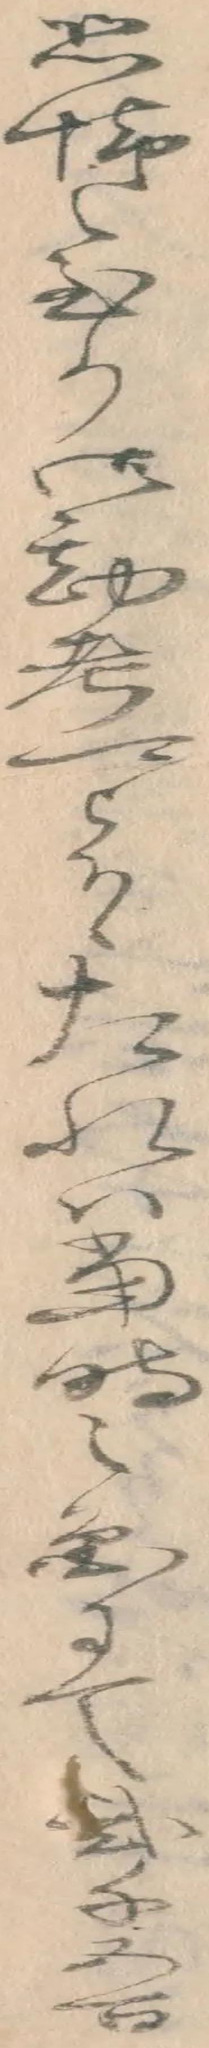恐怖之至り御勘考可被下候左れは当時之国にて弐千五百
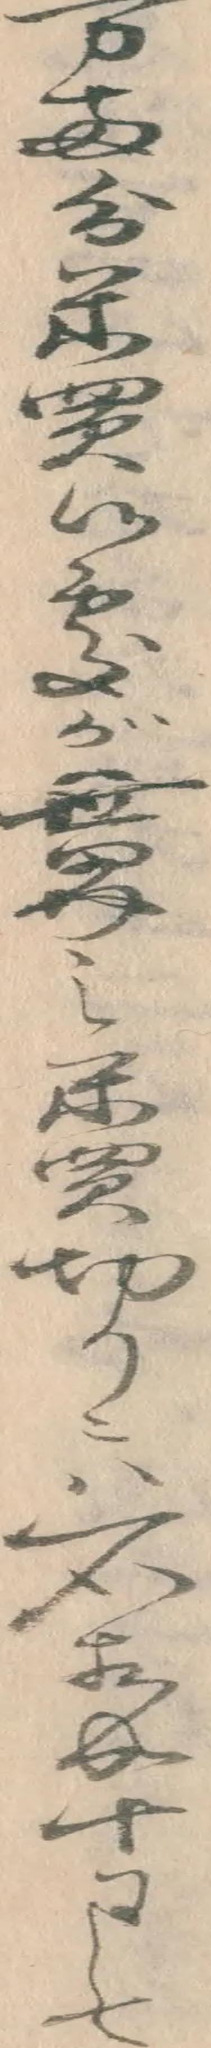万両分米買候処が世界之米買切りには不相成十にして
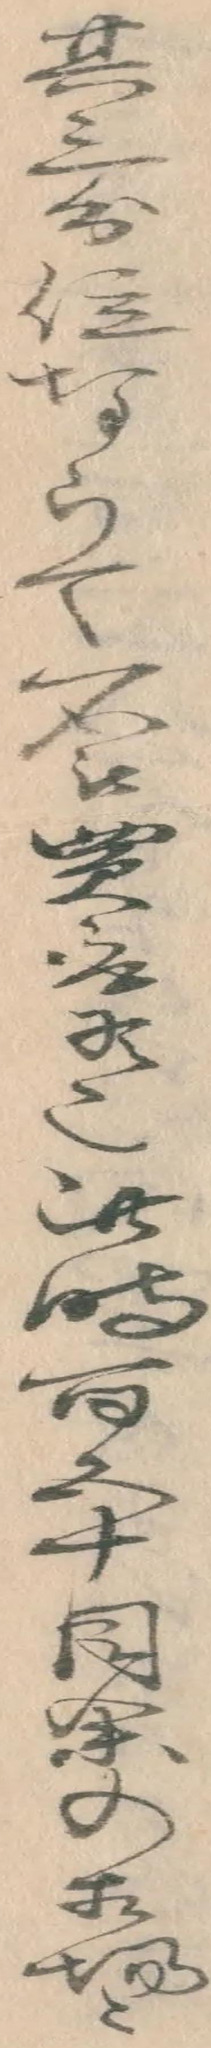其三分位ならて不被買取候也此時百五十目余の相場と
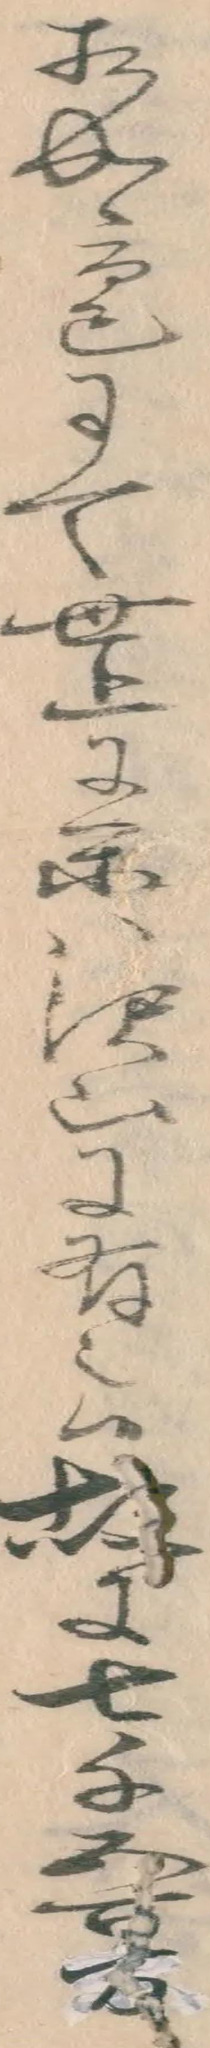相成候而已にて世上に米は沢山に有之候故に七千五百万
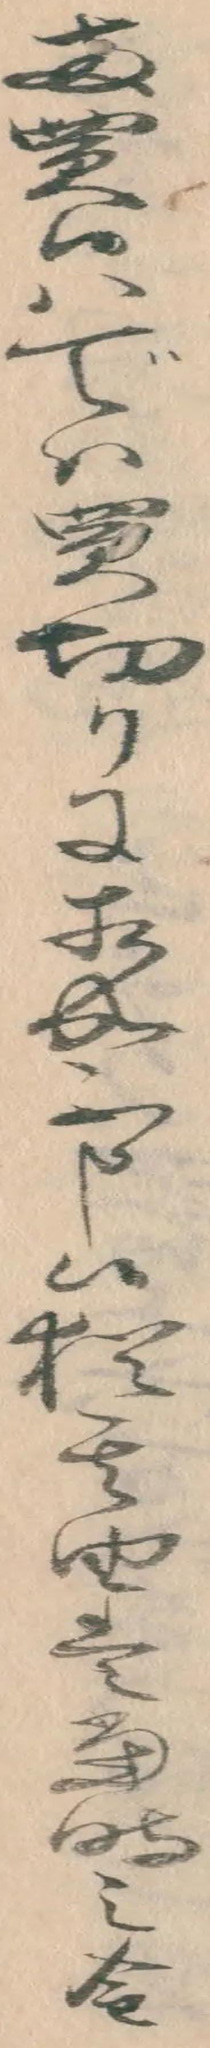両買候はでは買切りに相成不申候猶其由は当時之金
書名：斎庭之穂
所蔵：国立国会図書館 National Diet Library, JAPAN
